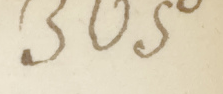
365
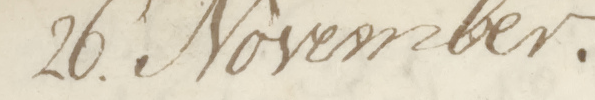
26. November.
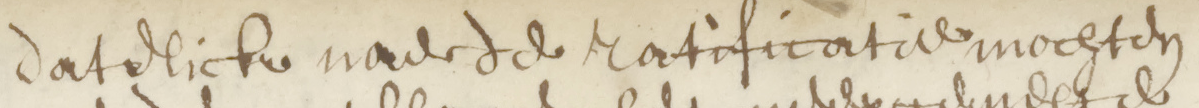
datelick nae de ratificatie mochten
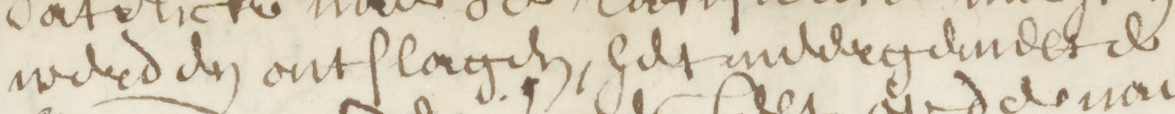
werden ontslagen, het meergemelte
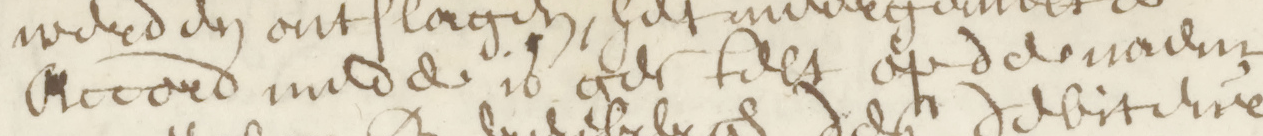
Accord mede is gestelt opde naem
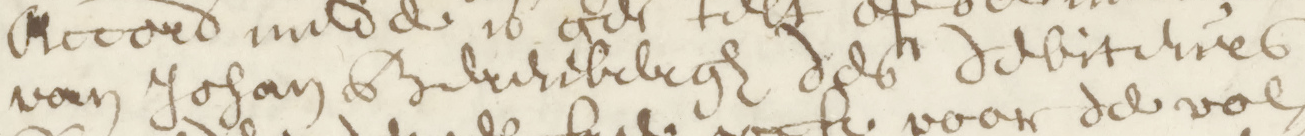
van Johan Berenbergh des debiteurs
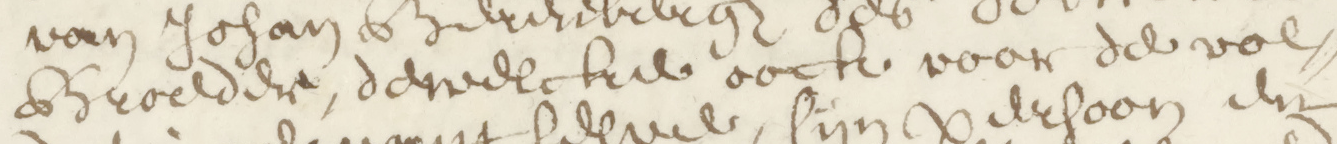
Broeder, dewelcke oock voor de vol„
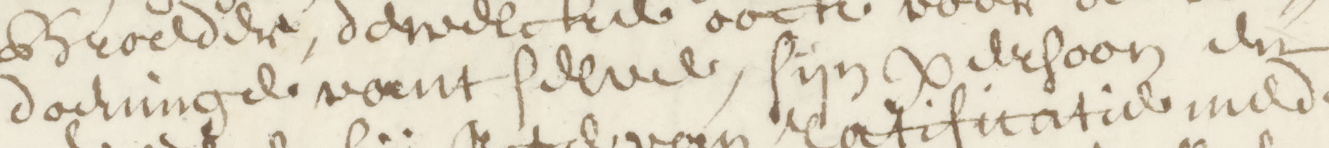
doeninge vant selve, sijn persoon en
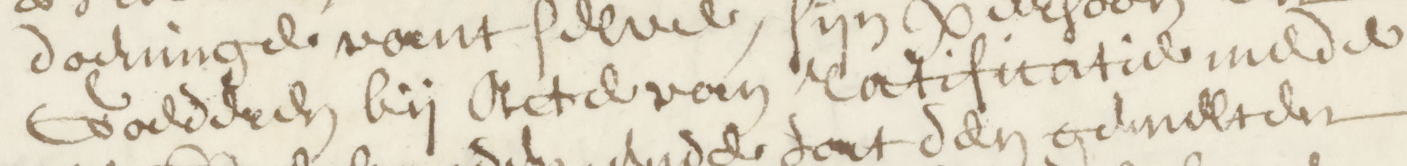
Goederen bij Acte van ratificatie mede
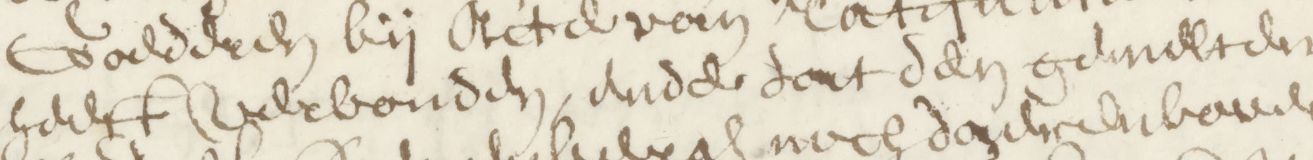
heeft verbonden, ende dat den gemelten
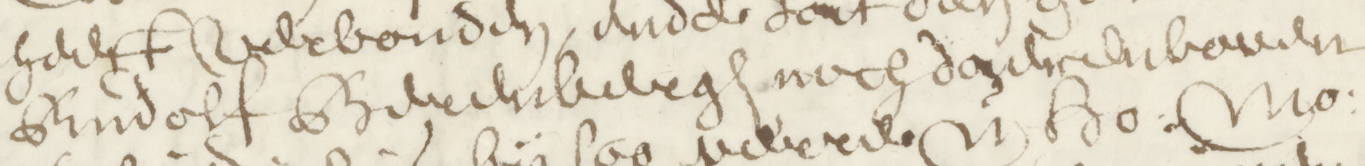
Rudolf Berenbergh noch daerenboven
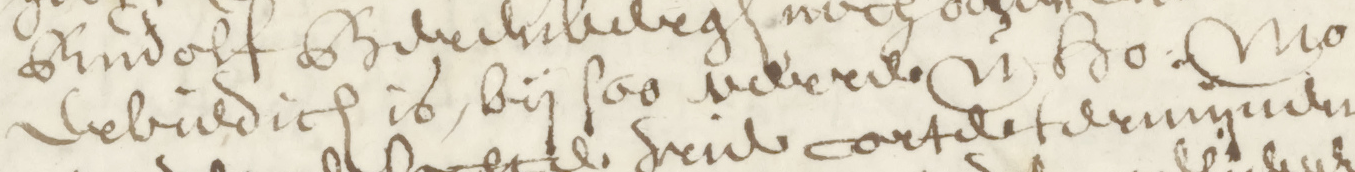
Erbiedich is, bij soo verre U Ho:Mo:
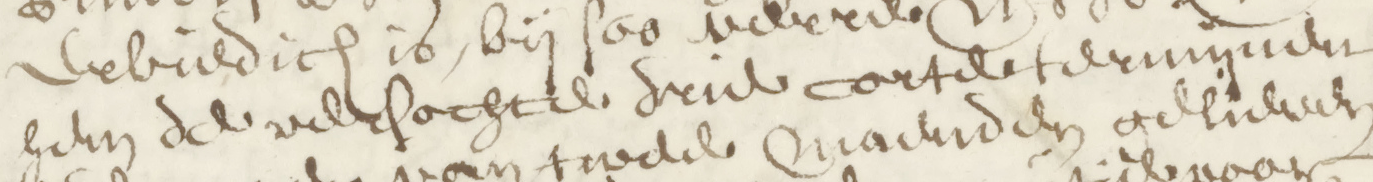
hem de versochte drie corte termijnen
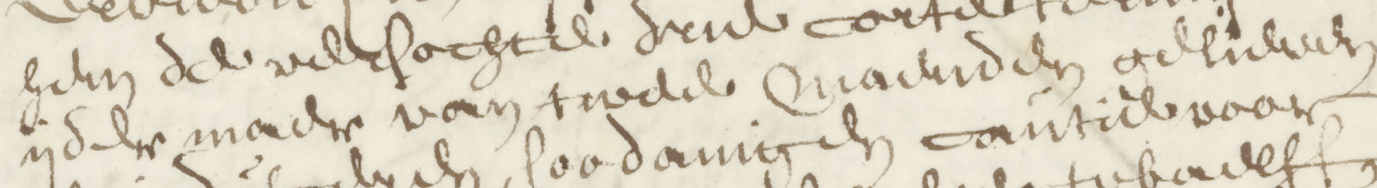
ijder maer van twee maenden gelieven
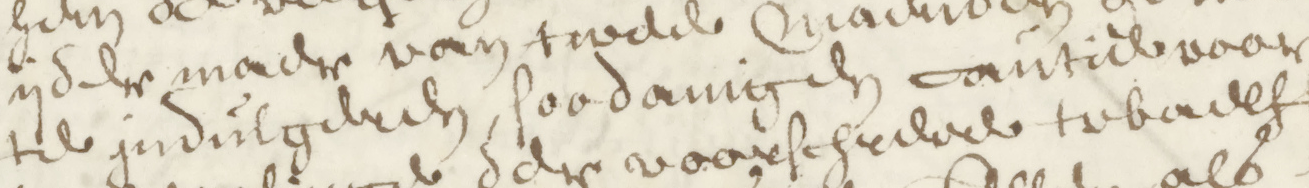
te indulgeren, soodanigen cautie voor
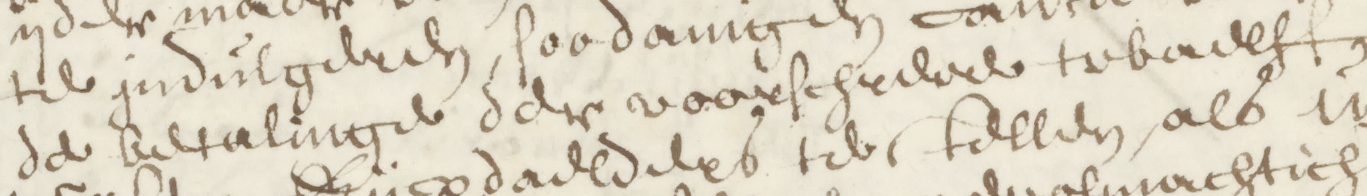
de betalinge der voorschreve twaelff
